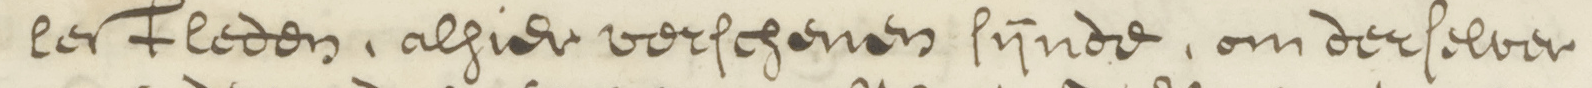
lestleden, alhier verschenen sijnde, om derselver
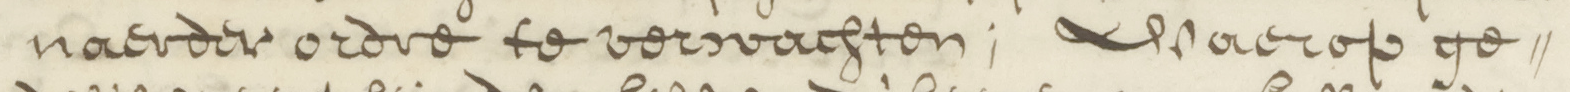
naerder ordre te verwachten; Waerop ge,,
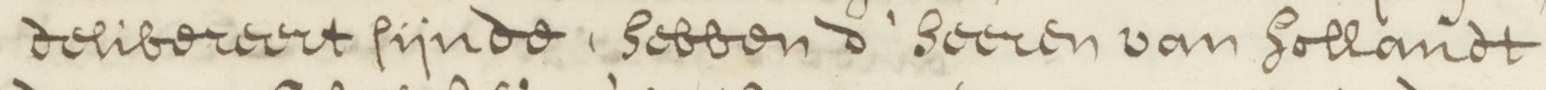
delibereert sijnde, hebben d'heeren van Hollandt
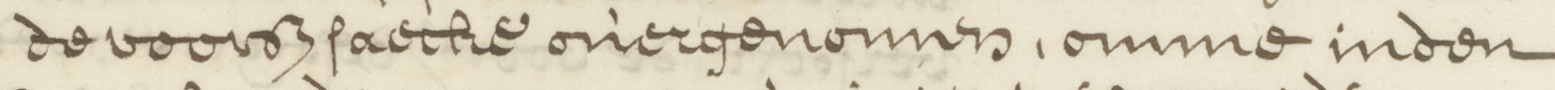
de voorsz saecke ouergenomen, omme inden
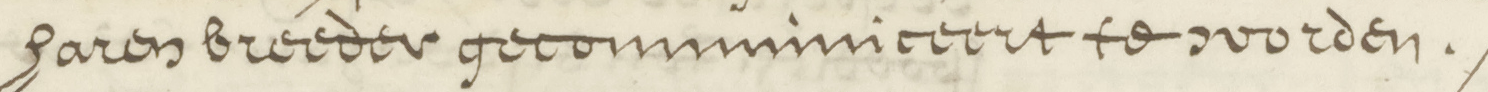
haren breeder gecommuniceert te worden.
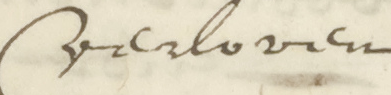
Verloven
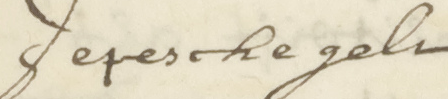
Depeschegelt
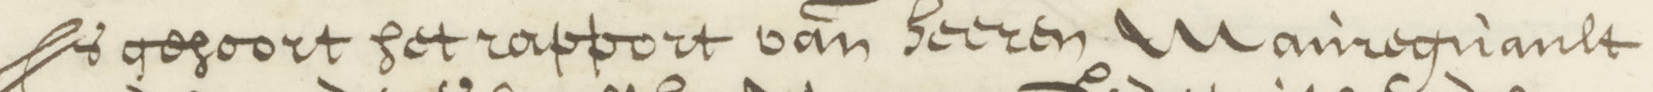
Is gehoort het rapport van heeren Mauregnault,
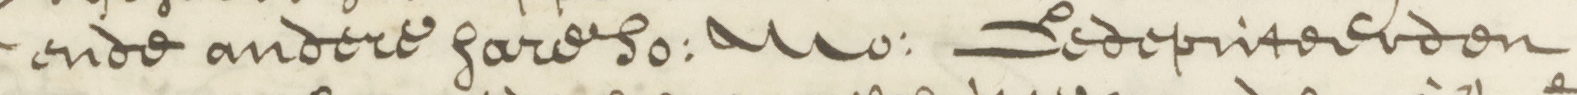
ende andere hare ho:Mo: Gedeputeerden
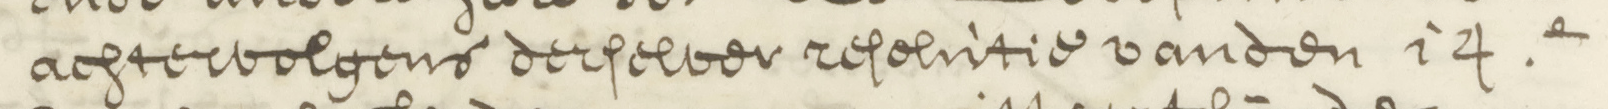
achtervolgens derselver resolutie vanden 14e.
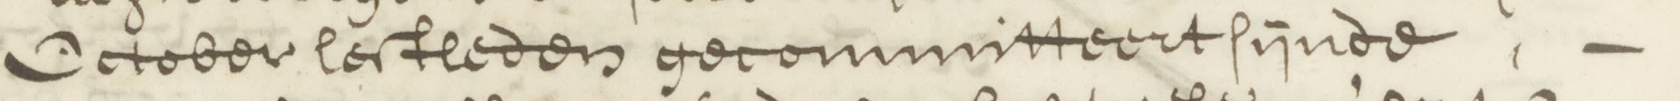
October lestleden gecommitteert sijnde, —
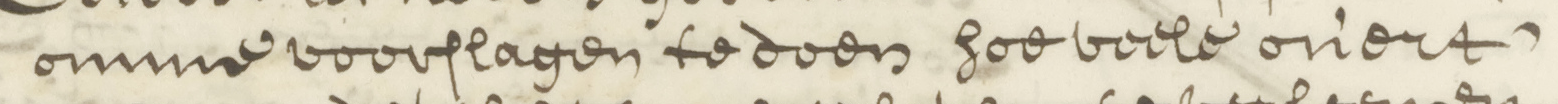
omme voorslagen te doen hoe veele ouert'
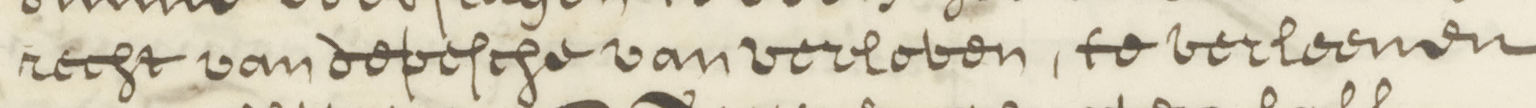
recht van depesche van verloven, te verleenen
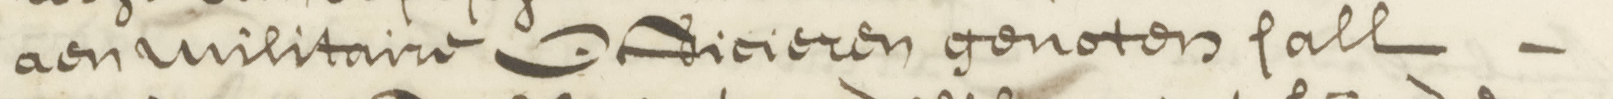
aen militaire Officieren genoten sall -
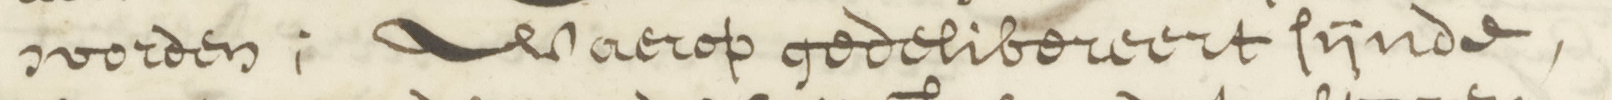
worden; Waerop gedelibereert sijnde,
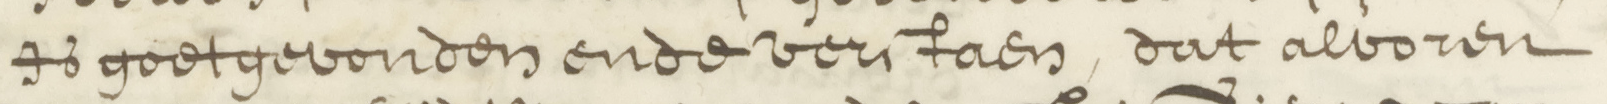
Is goetgevonden ende verstaen, dat alvoren
